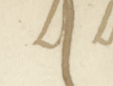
44
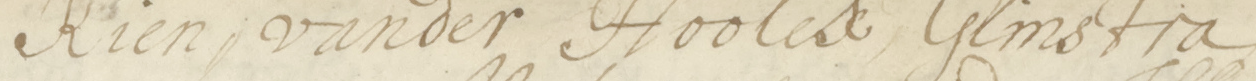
Kien, vander Hoolck, Glinstra,
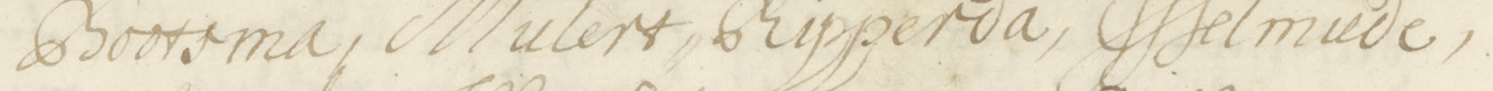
Bootsma, Mulert, Ripperda, Isselmude,
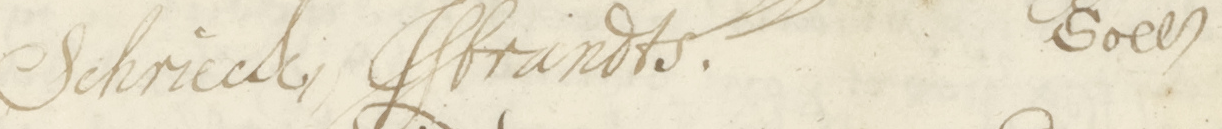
Schrieck, Isbrandts. Coll
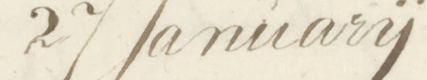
27 Januarij.
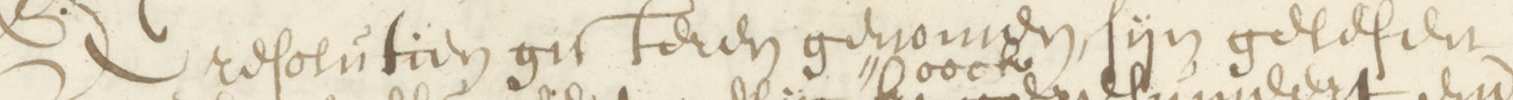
De resolutien gisteren genomen, sijn gelesen
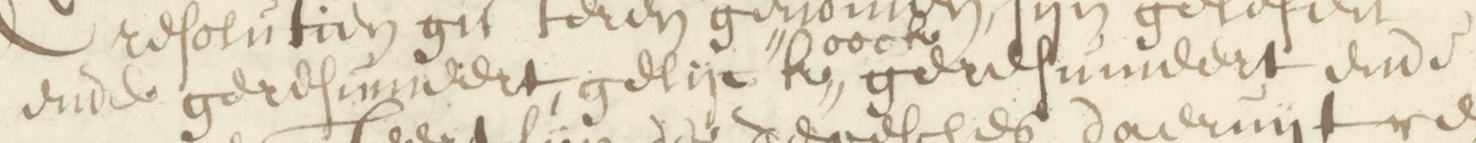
ende geresumeert, gelijck oock geresumeert ende
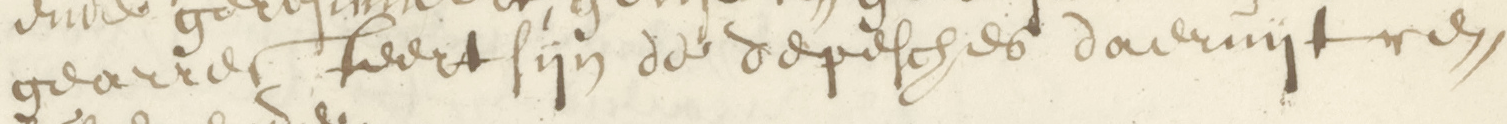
gearresteert sijn de depesches daeruijt re„
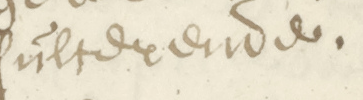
sulterende.
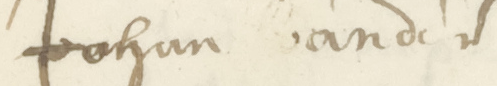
Johan vander
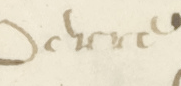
Perre
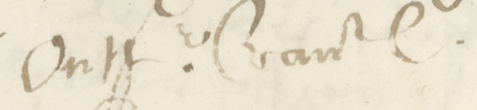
Ontfr. van C.
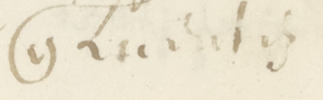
& Licenten
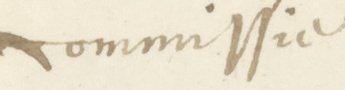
commissie
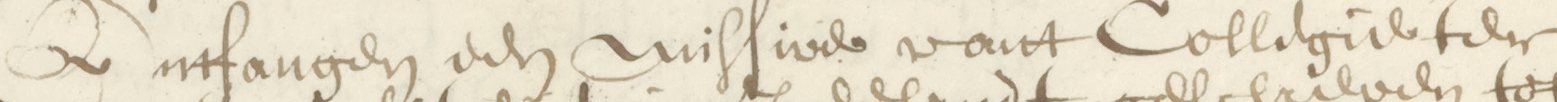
Ontfangen een missive vant Collegie ter
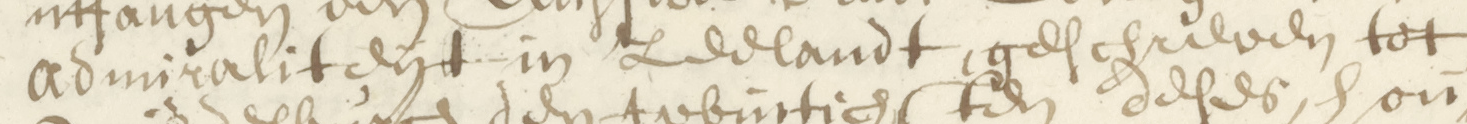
Admiraliteijt in Zeelandt, geschreven tot
